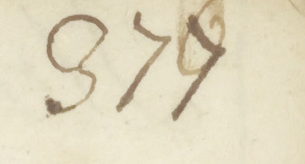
377
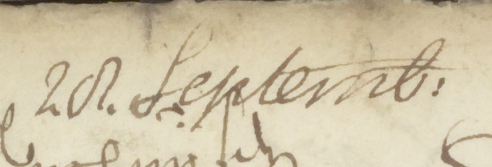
28. Septemb:
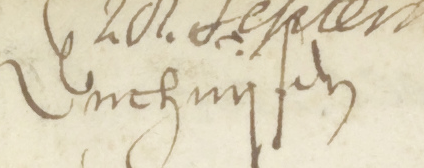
Enchuijsen
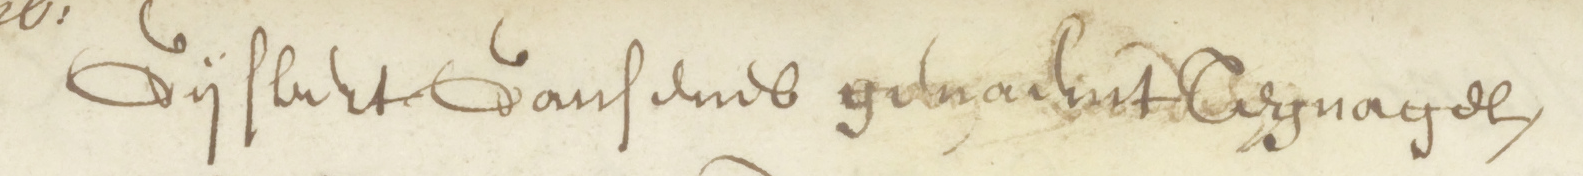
Gijsbert Ganseneb genaemt Tegnagel,
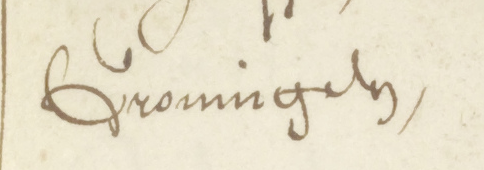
Groningen,
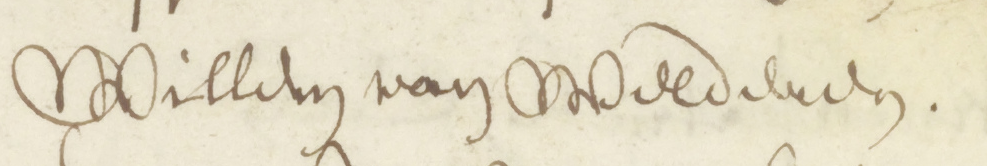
Willem van Welderen.
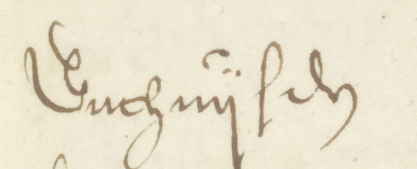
Enchuijsen
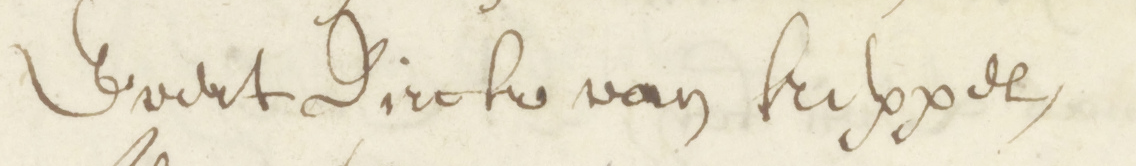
Evert Dirck van Keppel,
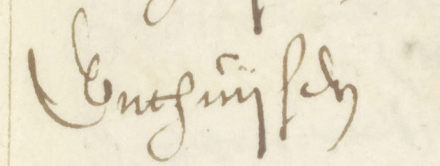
Enchuijsen
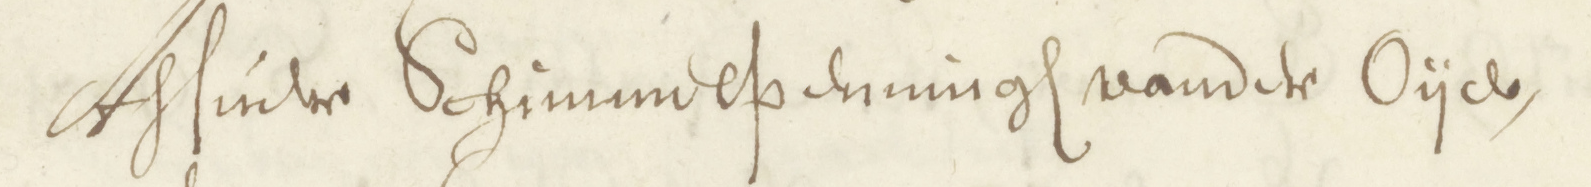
Assuer Schimmelpenningh vander Oije,
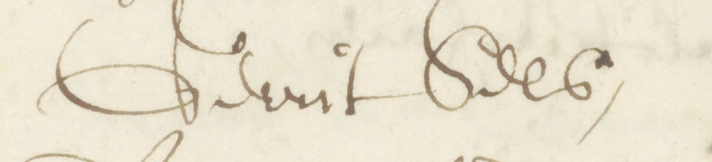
Gerrit Sels
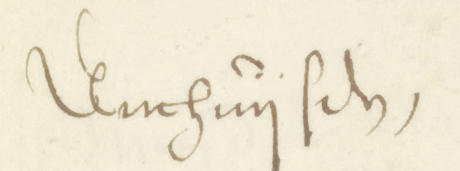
Enchuijsen,
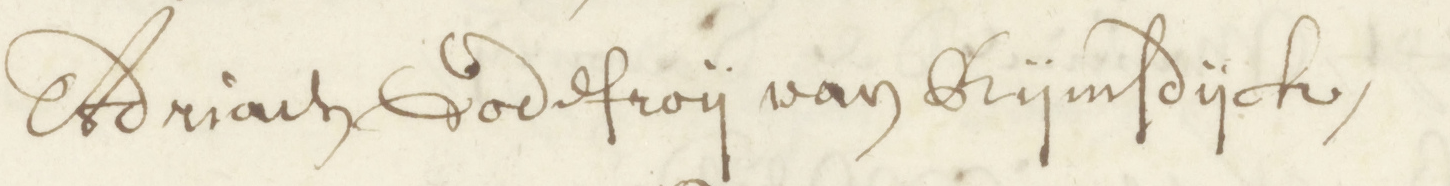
Adriaen Godefroij van Rijmsdijck,
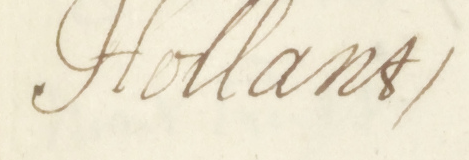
Hollant,
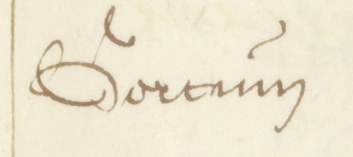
Gorcum
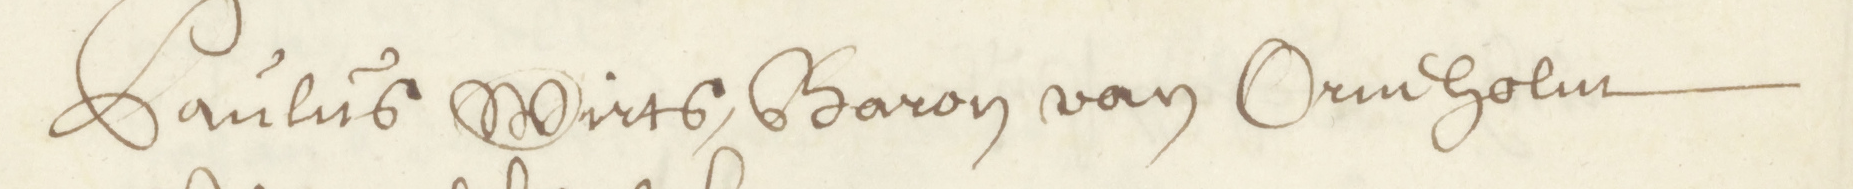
Baulus Wirts, Baron van Ormeholm
